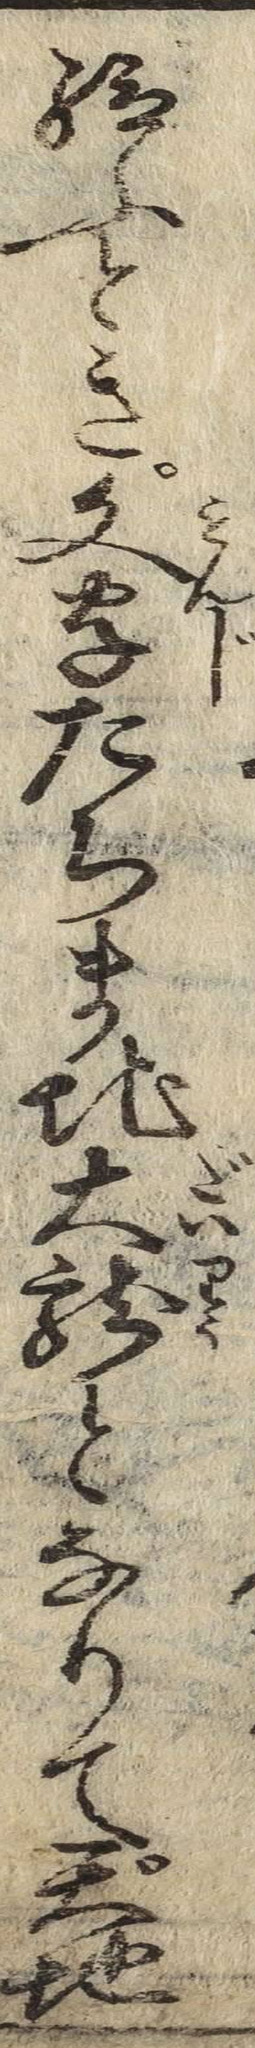給ふとき。文字たちまち大竜となりて。天地
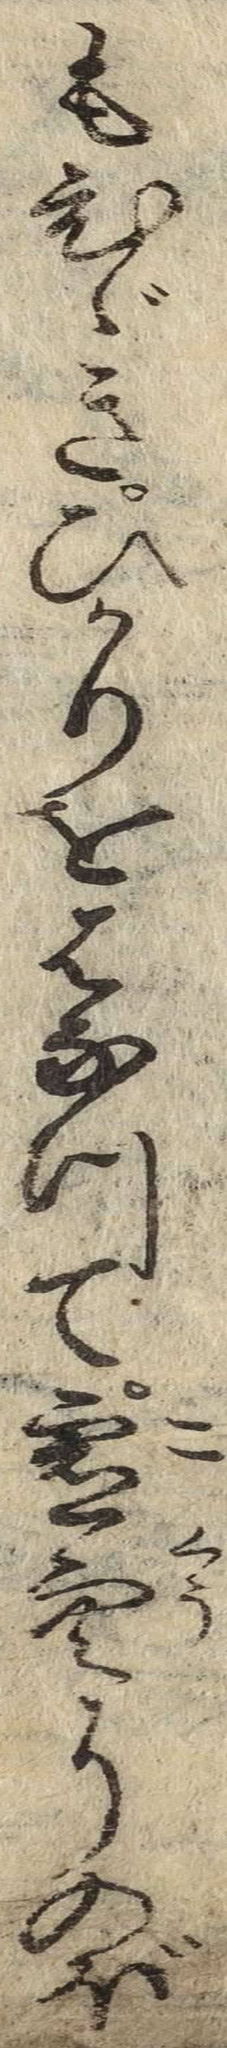もひびき。ひかりをはなつて。虚空にのぼ
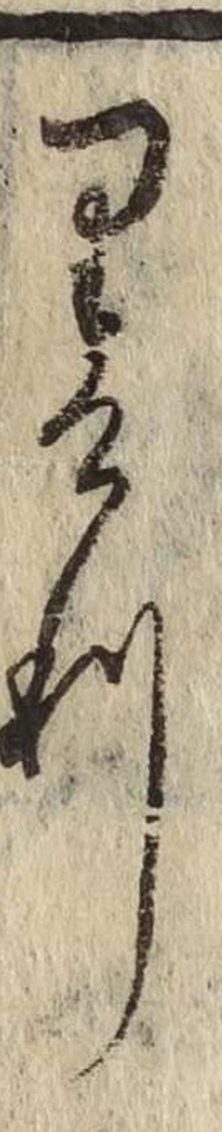りけり

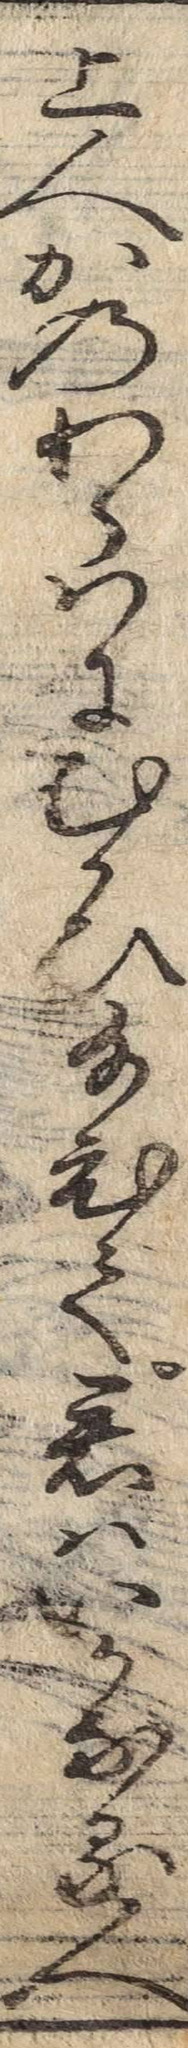上人かのわらはにむかひ給ひ手。君はいかなる人
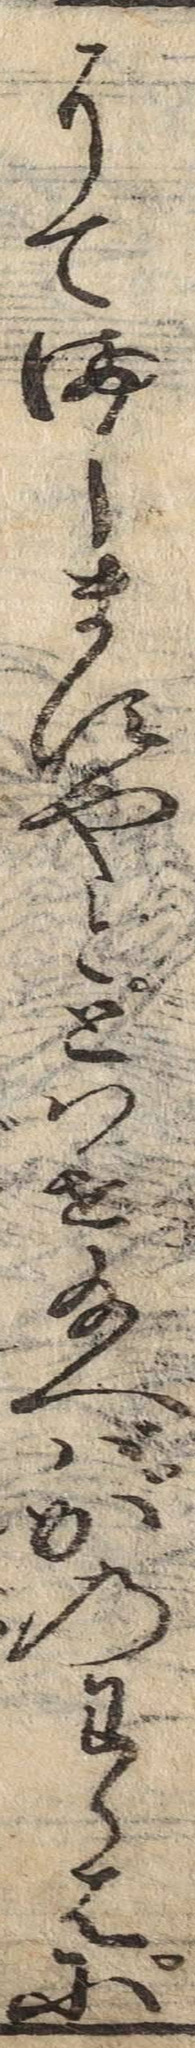にてましますやと。とはせ給へば。かのわらは。に
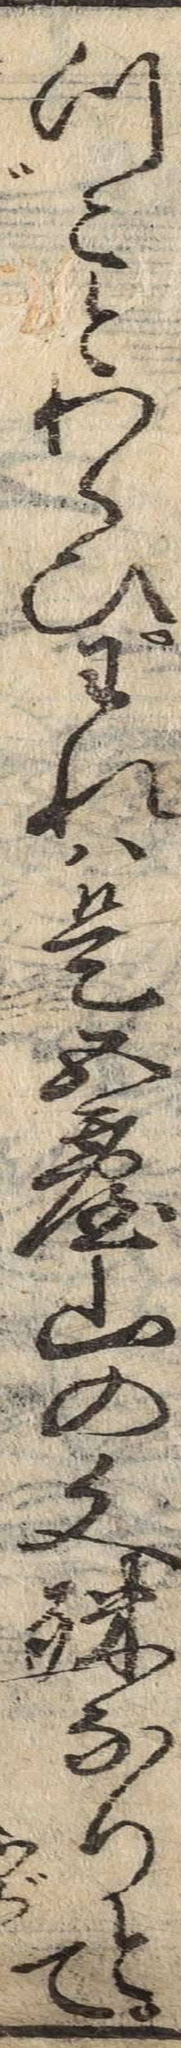つことわらひ。われは是五台山の文殊なりとて。
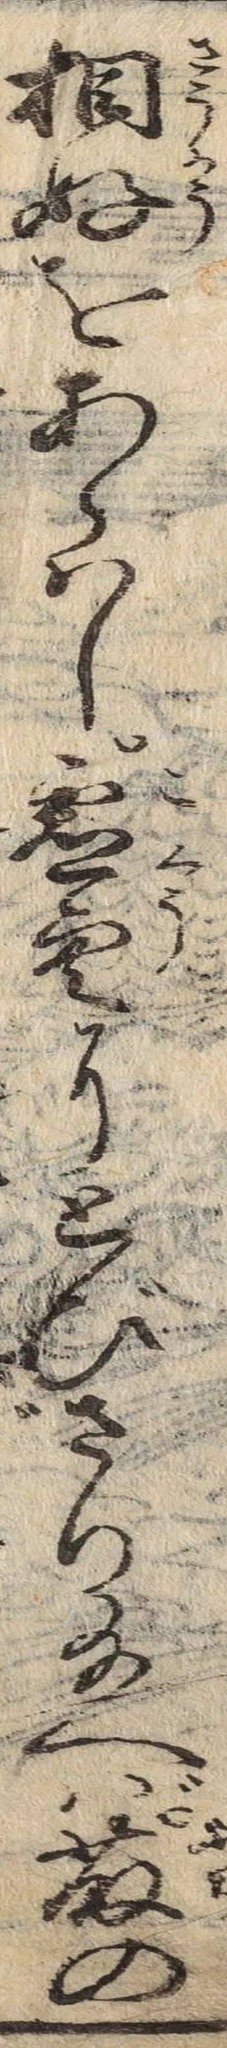相好をあらはし。虚空にとびさり給へば。藤の
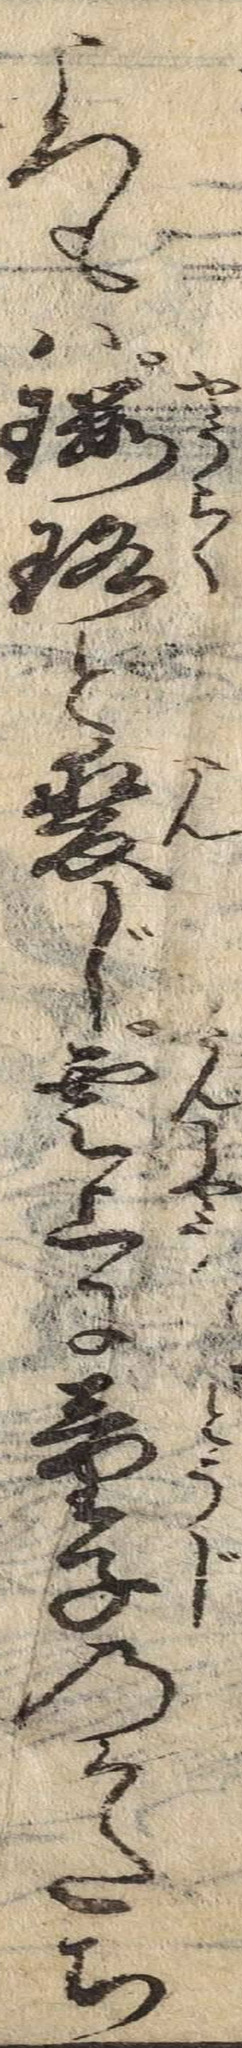ころもは。瓔珞と変じ。雲上に童子のかたち
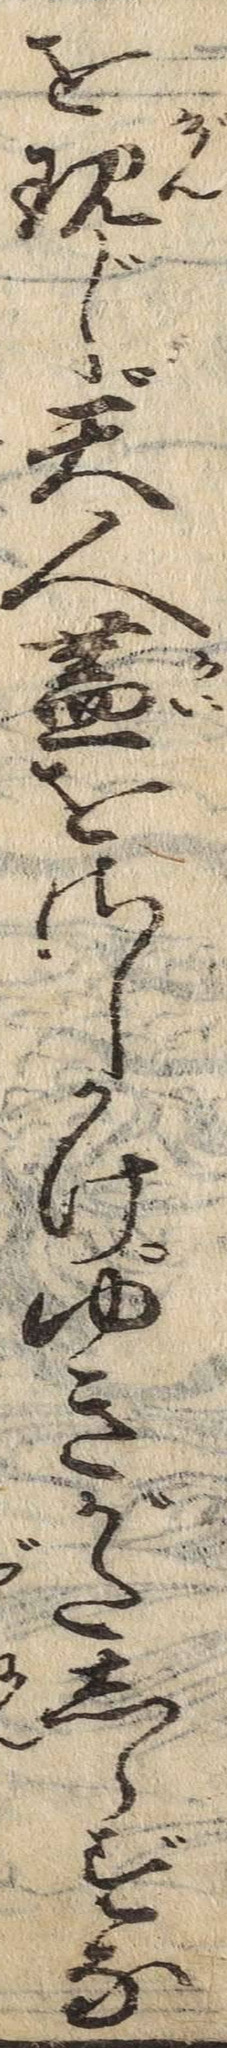を現じ。天人蓋をさしかけ。ゆきがたしらずな
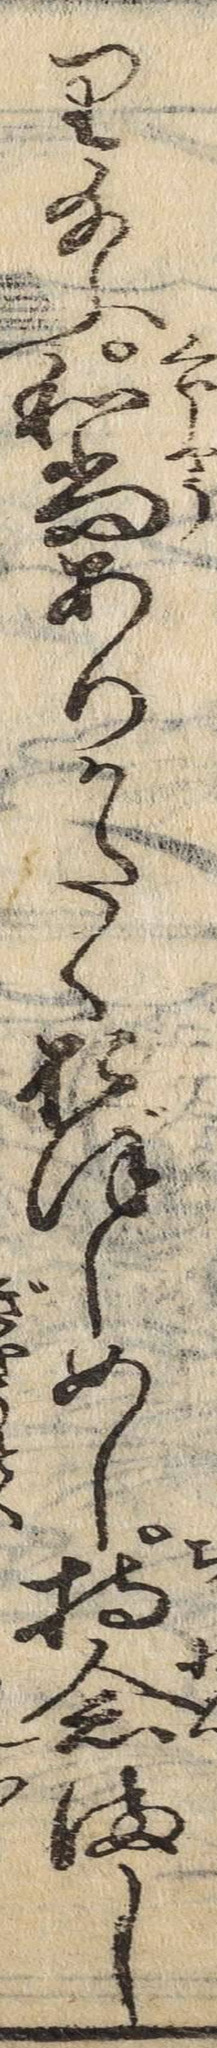り給ふ。和尚ありかたくおぼしめし。持念まし
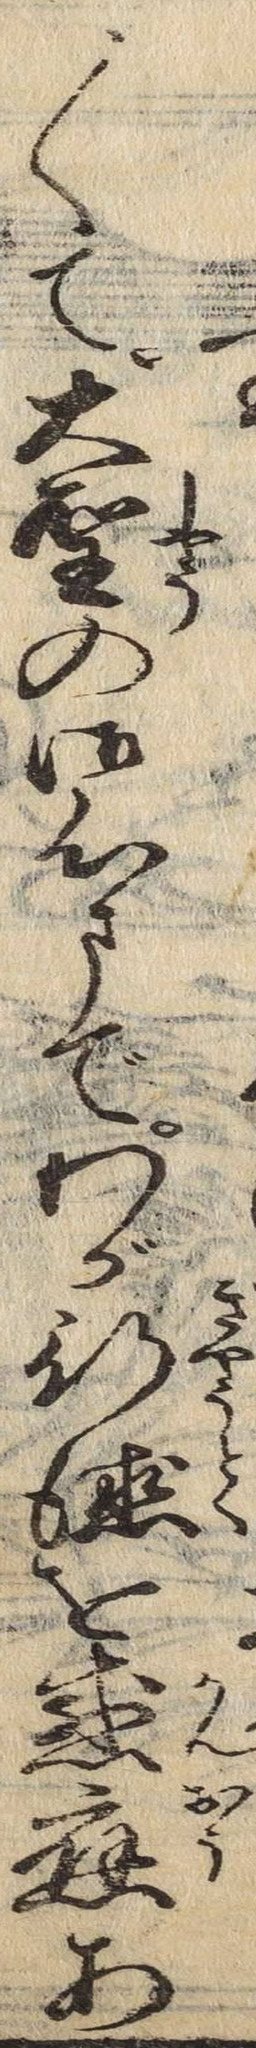〳〵て。大聖の御心まして。わが行徳を感応あ
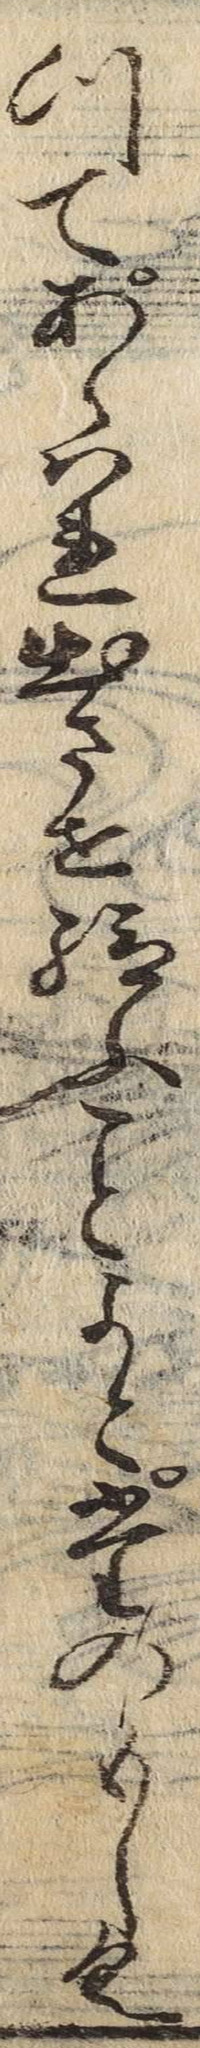つて。あらはれ出ませ給ふことよと、たのもしく
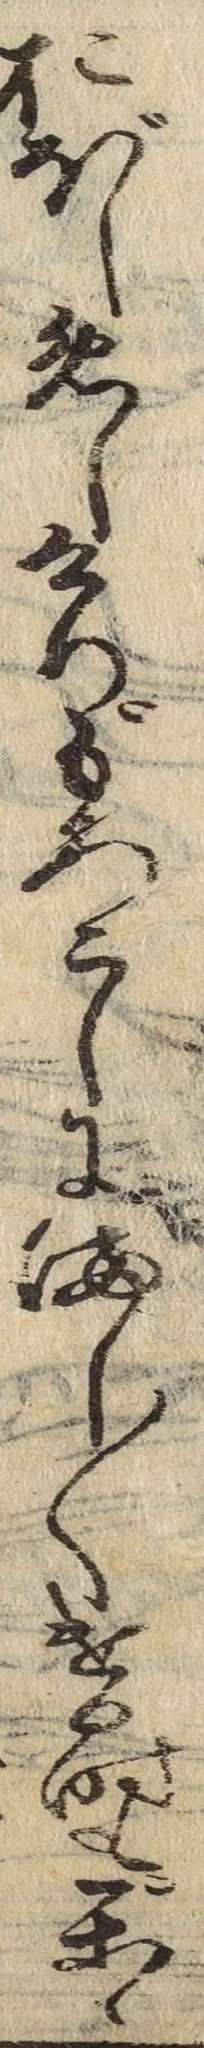おぼしめしけり。もろこしにまし〳〵ける時もかゝ
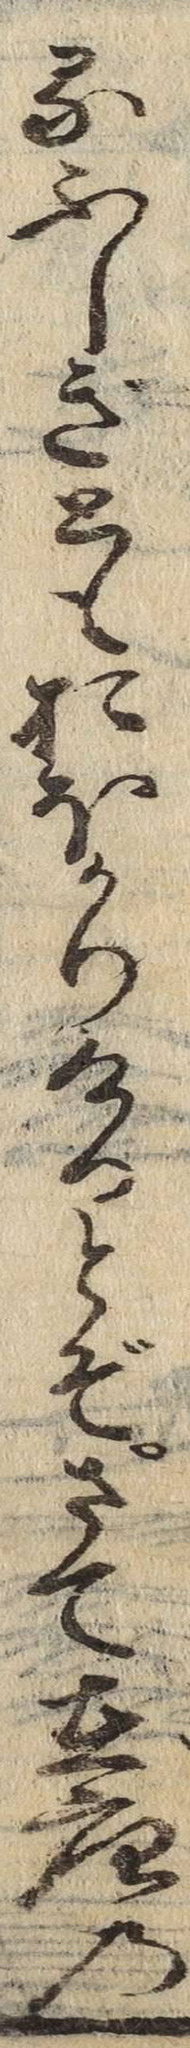るふしぎともおほかりけるとぞ。さて在唐の
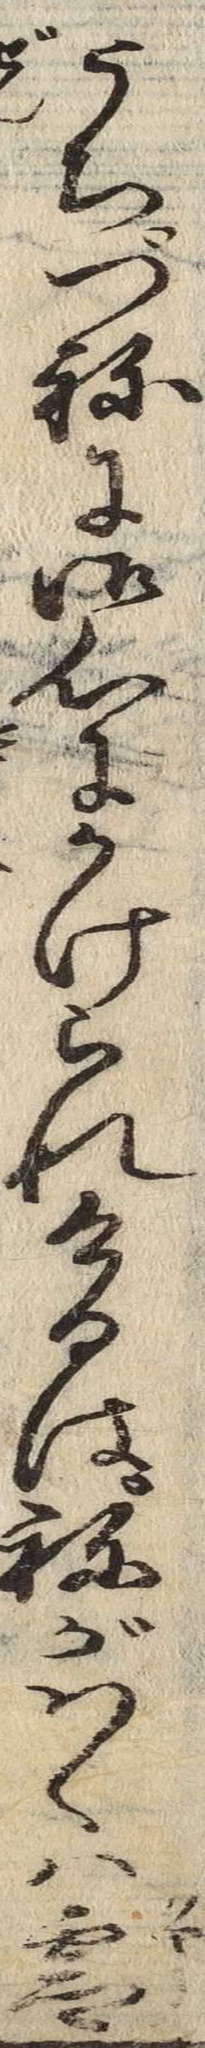うち。つねに御心にかけられけるは。ねがはくは霊
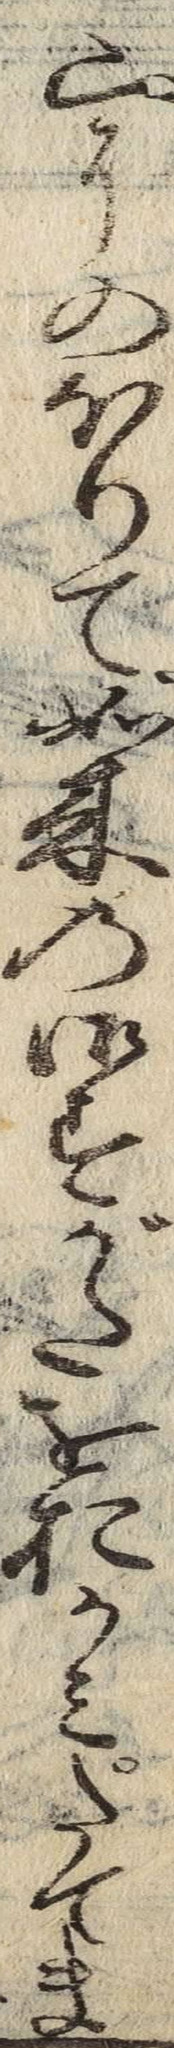山にのぼりて如来の御すがたをおかみ。たてま
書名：弘法大師御傳記
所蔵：京都府立京都学・歴彩館 国文学研究資料館
